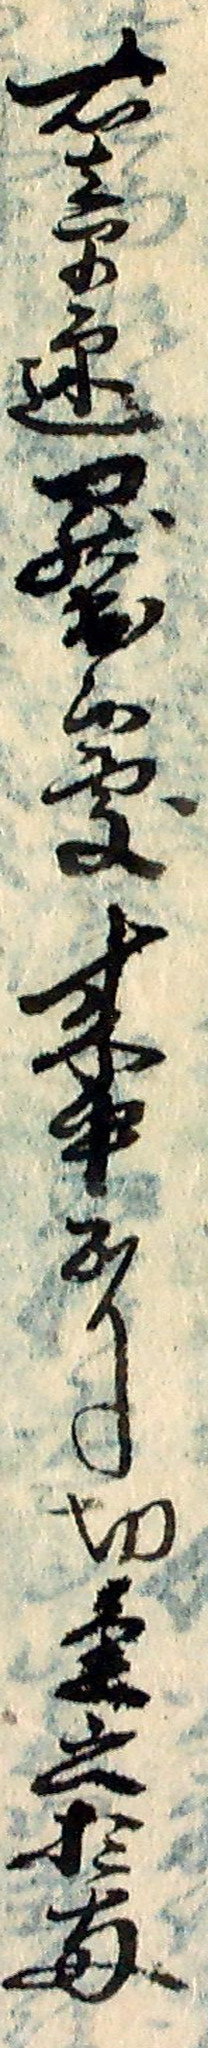右は早速罷出候処来申正月切金六拾両
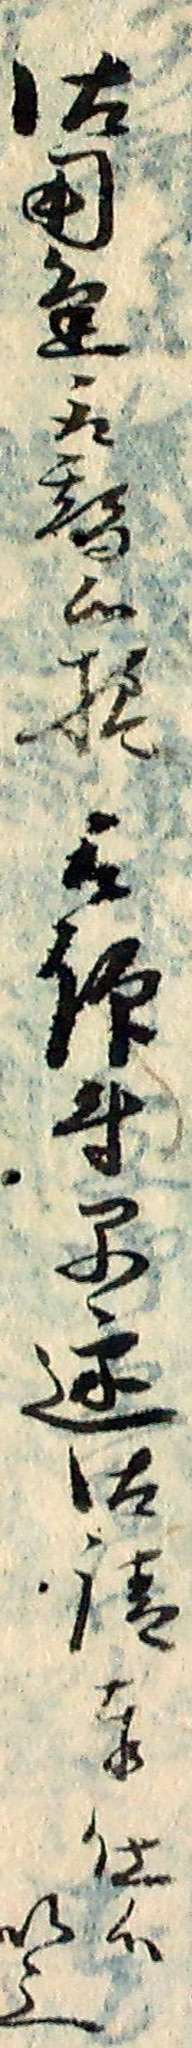御用金取替候様被仰付早速御請奉仕候
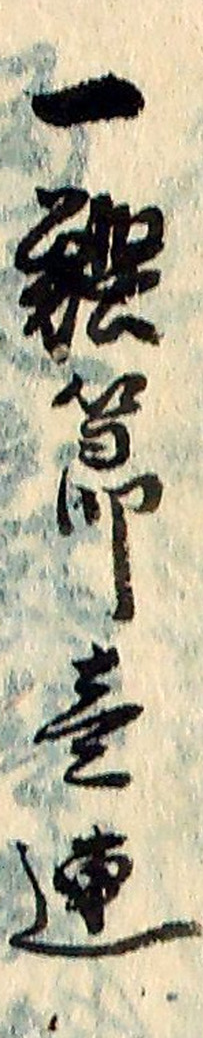一鰹節壱連
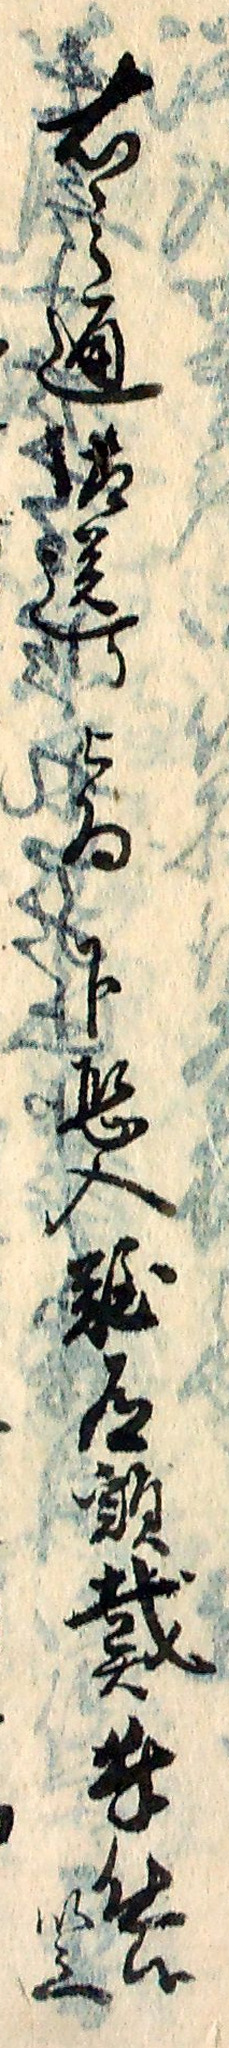右之通御送り被為下恐入難有頂戴奉仕候
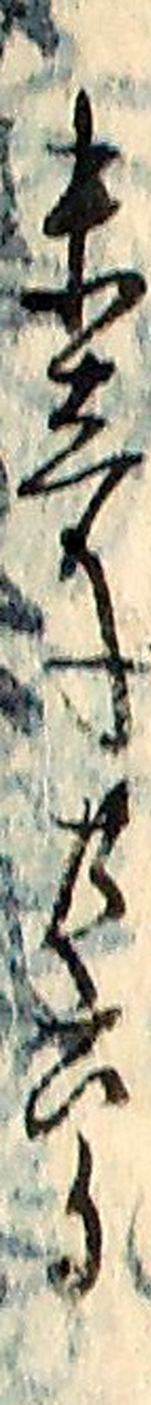未十二月廿五日
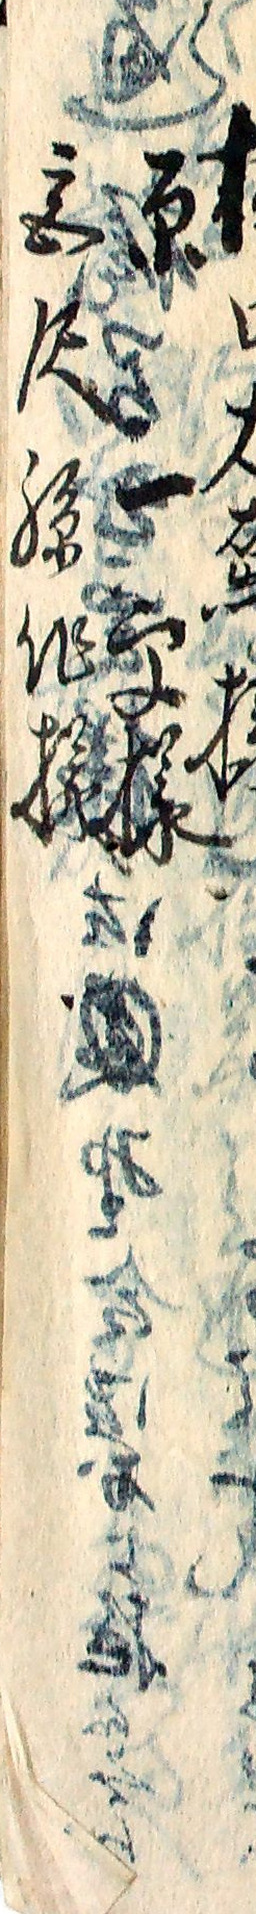宮沢孫作様
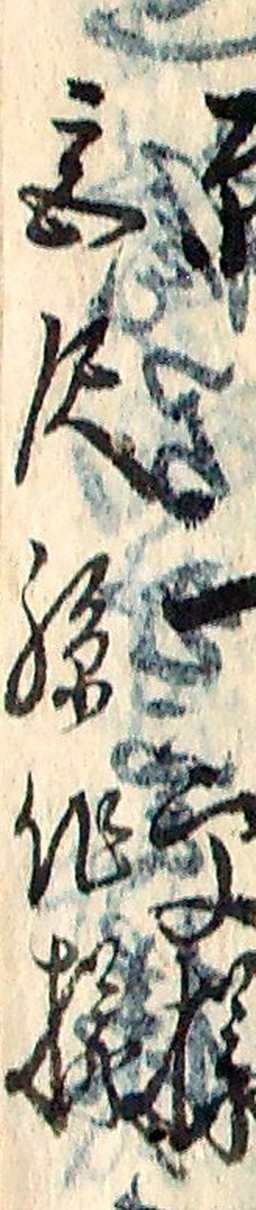宮沢孫作様

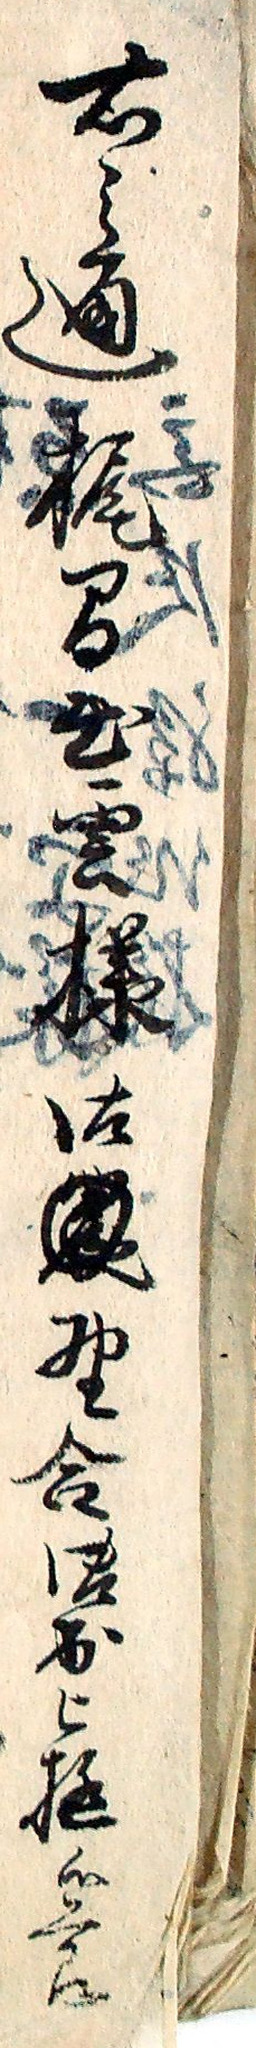右之通梶間出雲様御野合御出被遊候節
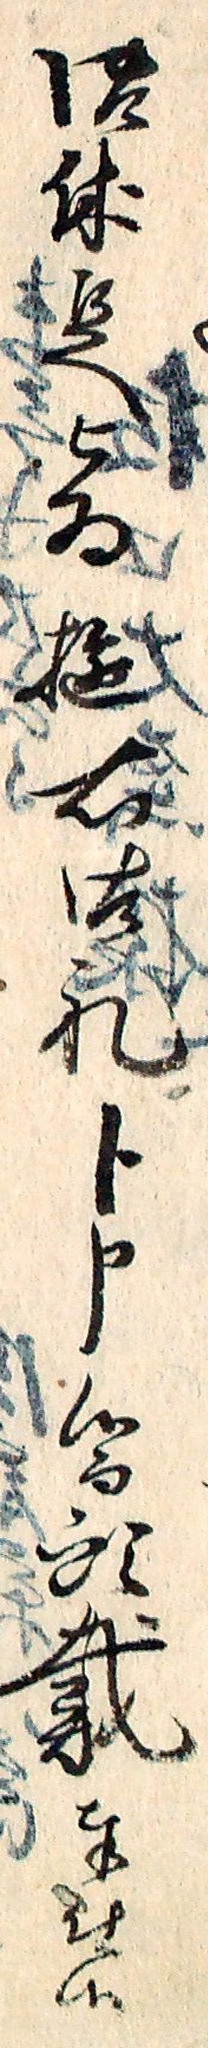御休足被為遊右御礼と申候て頂戴奉仕候
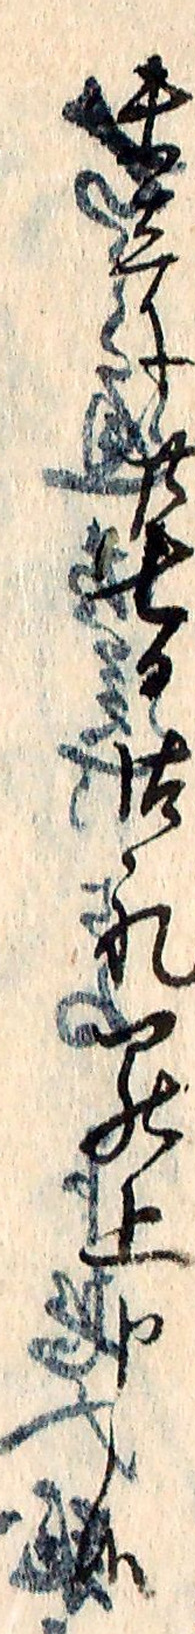未十二月廿七日御礼罷上申候

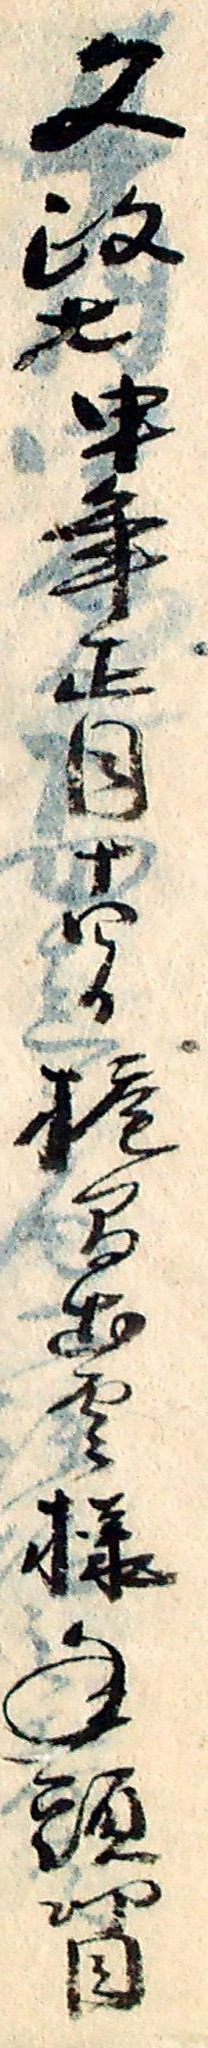文政七申年正月十四日梶間出雲様年頭御目
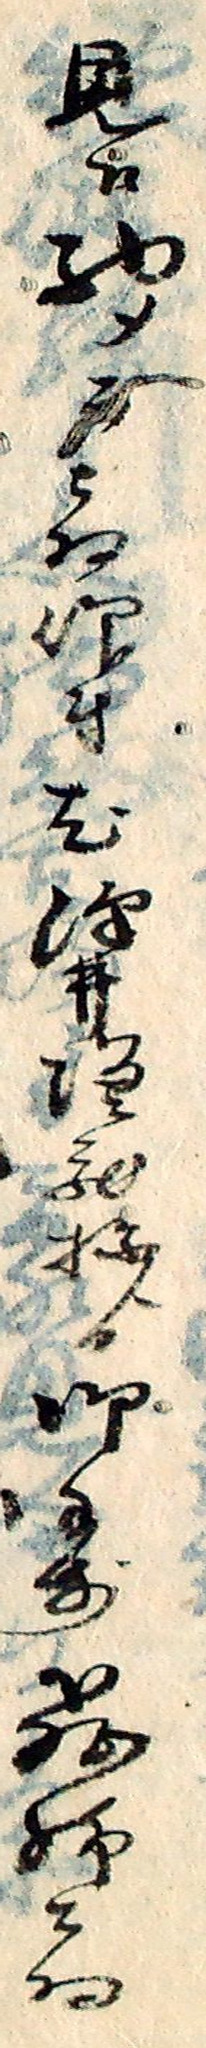見え初めて被為仰付尤沢井増蔵様ゟ御手紙飛脚被為
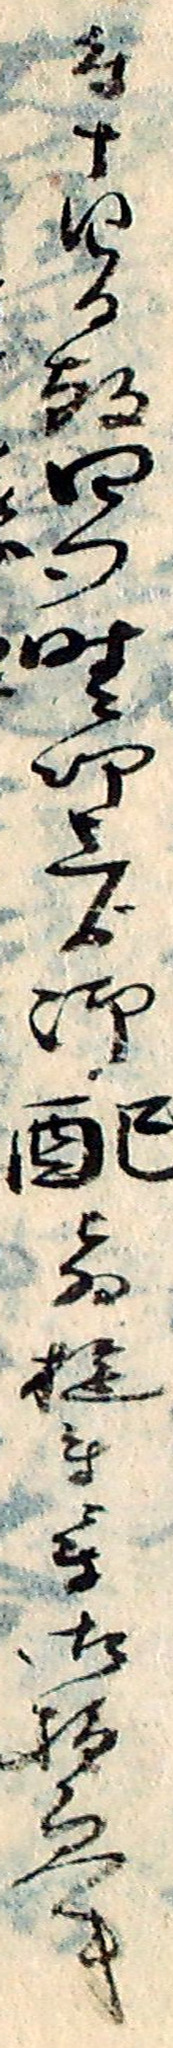付十四日朝四つ時に御上ゟ御配被為遊付に付御指急き
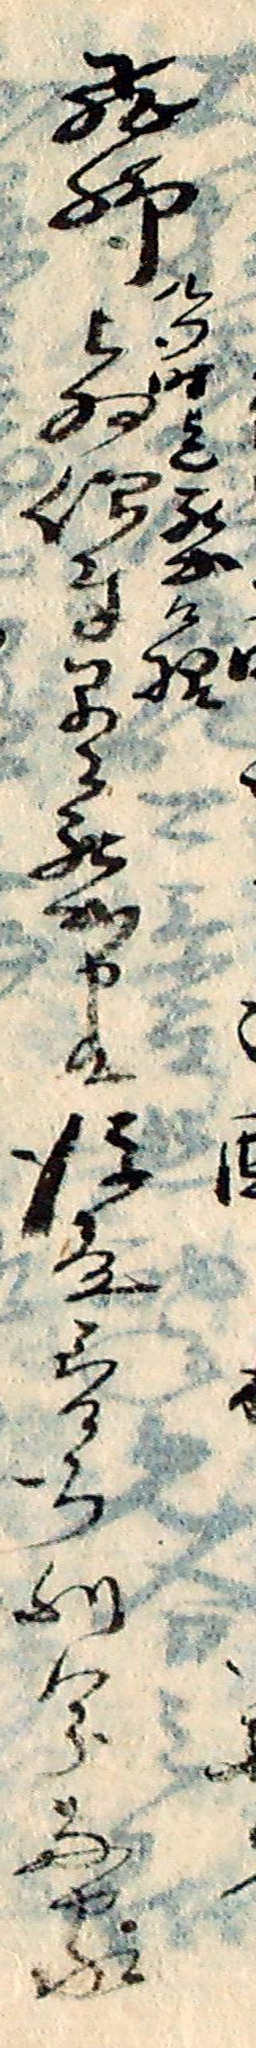被為仰付早々罷出申候後藤善右衛門利八郎当家
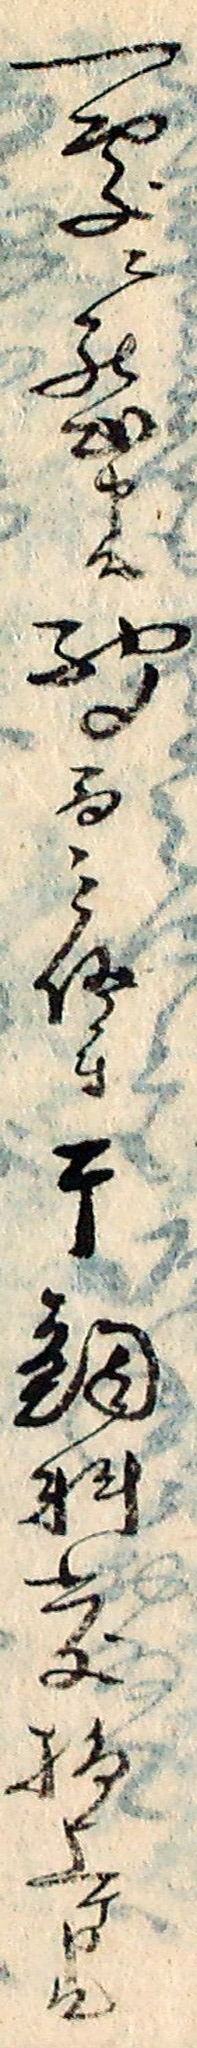一処に罷出申候初めて之儀に付干鯛料六文指上け申候
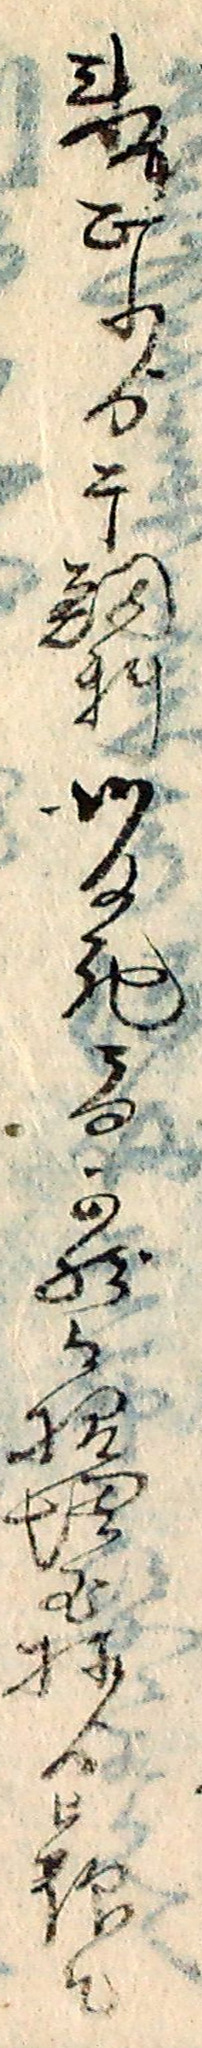来る正五ゟ干鯛料弐文宛にて可然候様増蔵様ゟ被仰候
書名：諸御願書控(後藤氏壱番）
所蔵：鳴門教育大学 Naruto University of Education
